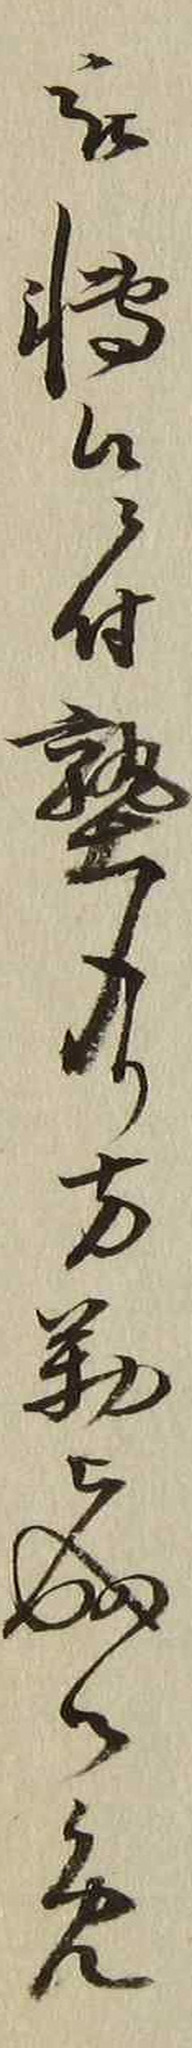被転候ニ付塾〆り方勤被成御免
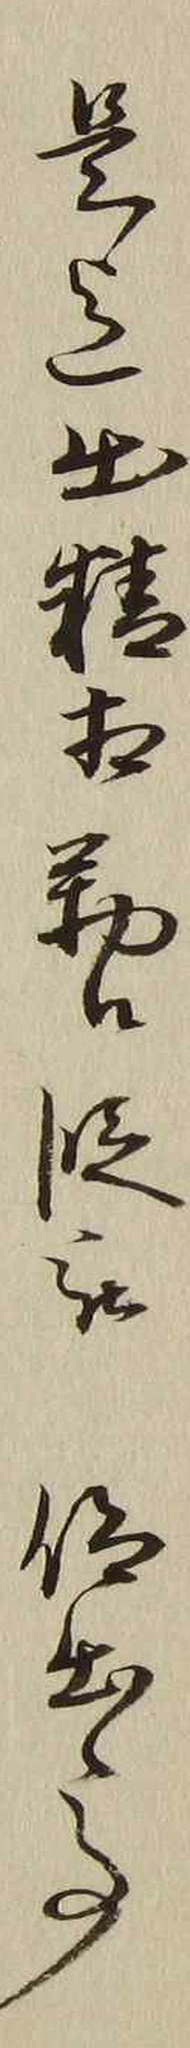是迄出精相勤候段被仰出候事
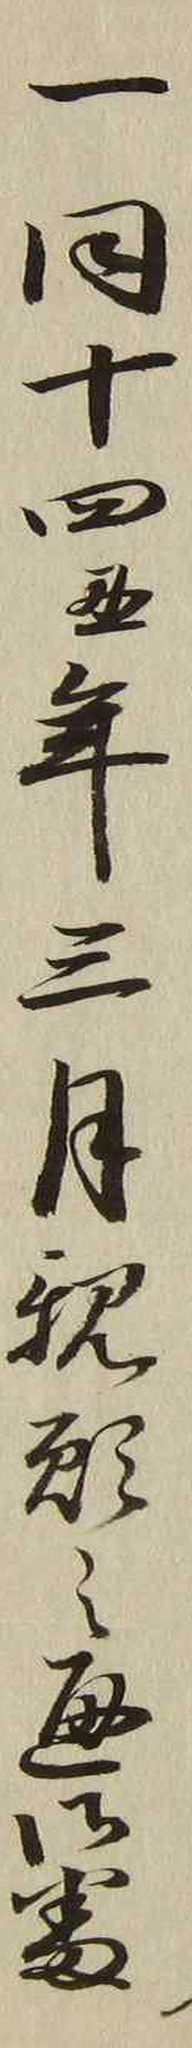一同十四丑年三月親願之通御番
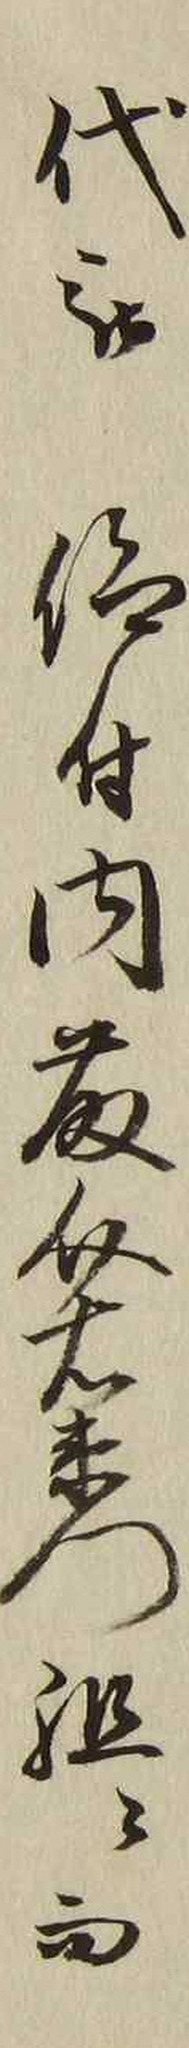代被仰付内藤介右衛門組ニ而
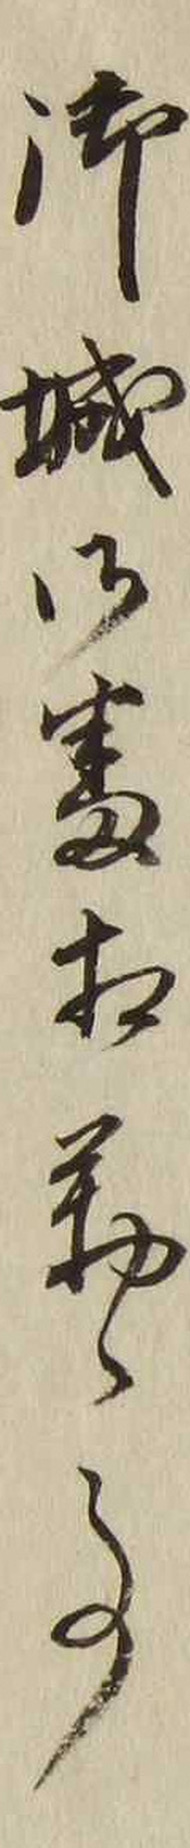御城御番相勤候事

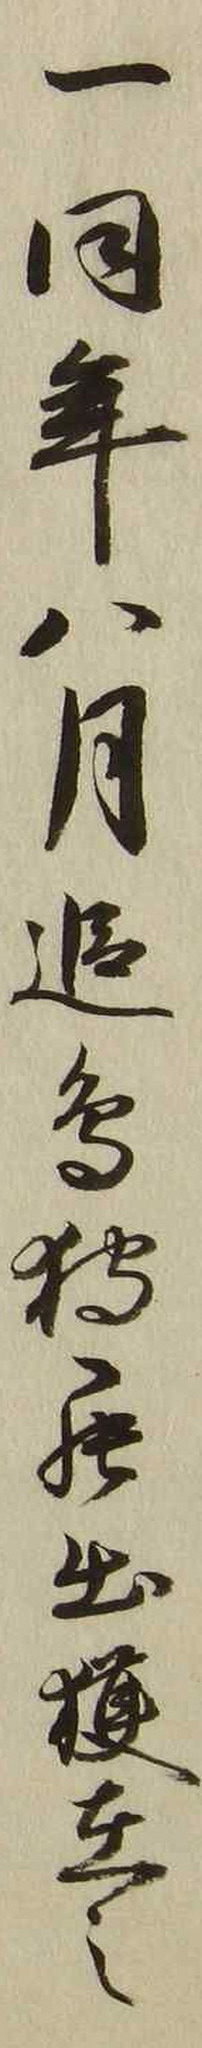一同年八月追鳥狩罷出獲在之
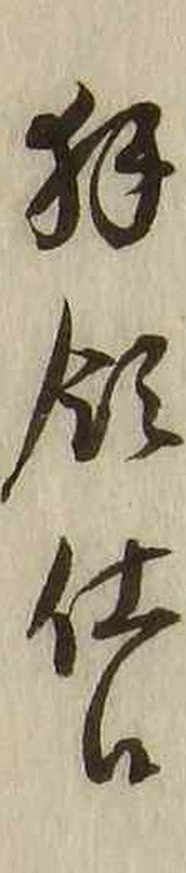拝領仕候
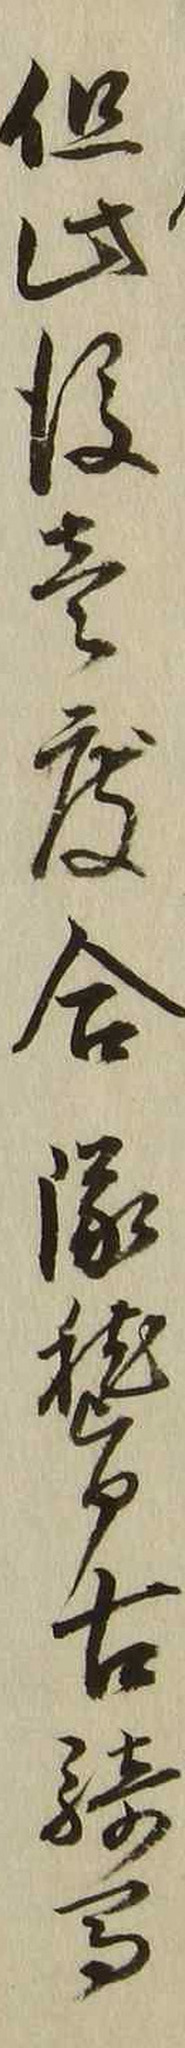但此後壱度合隊稽古騎馬
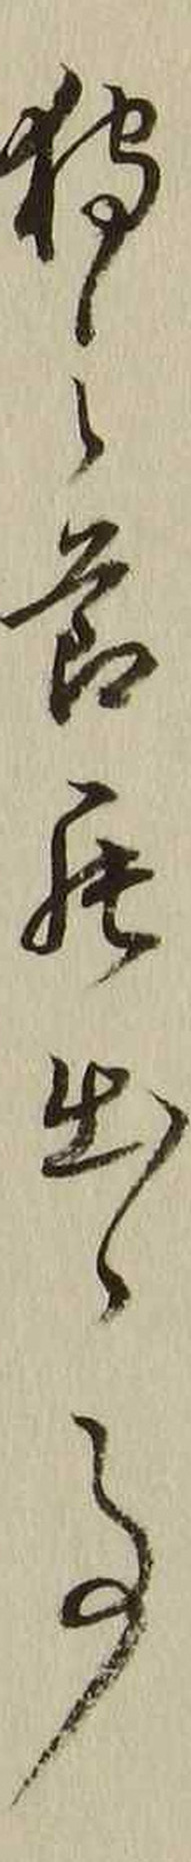狩之節罷出候事
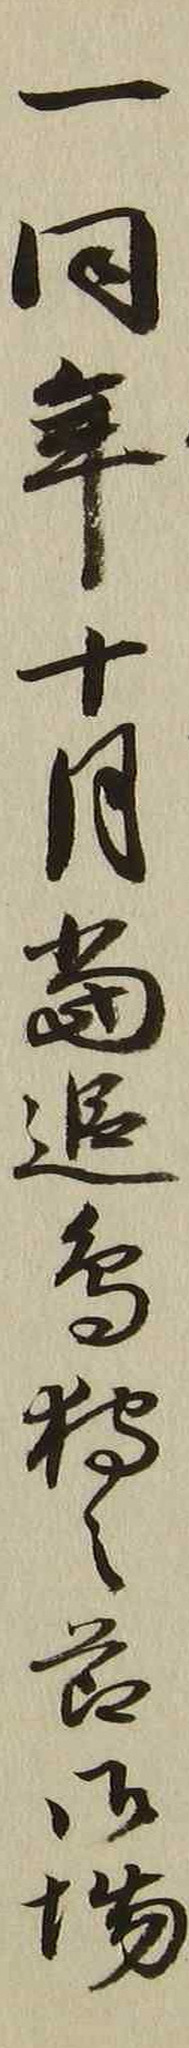一同年十月当追鳥狩之節御場
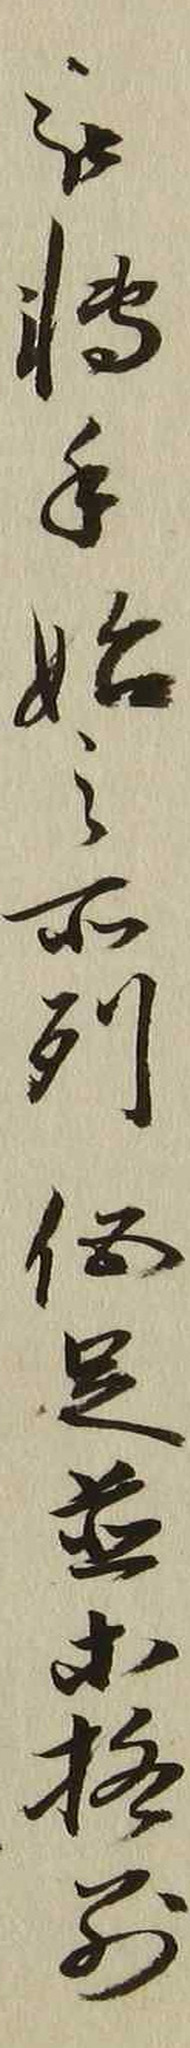被転手始之所列伍足並等格別
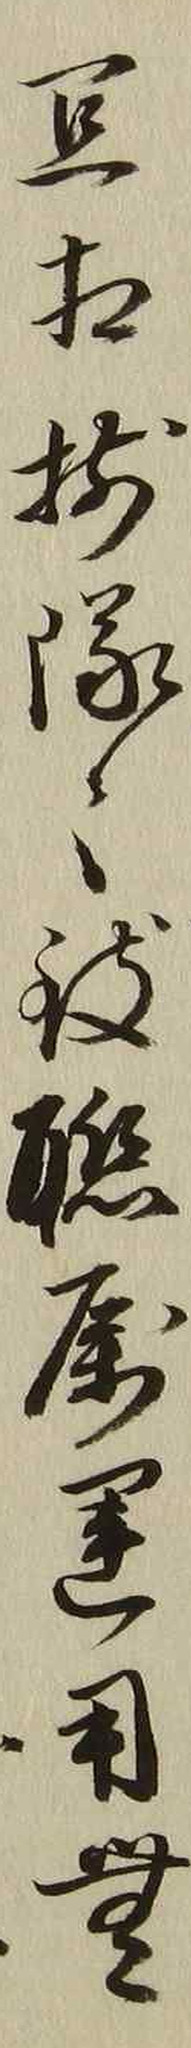宜相揃隊々致聯属運用無
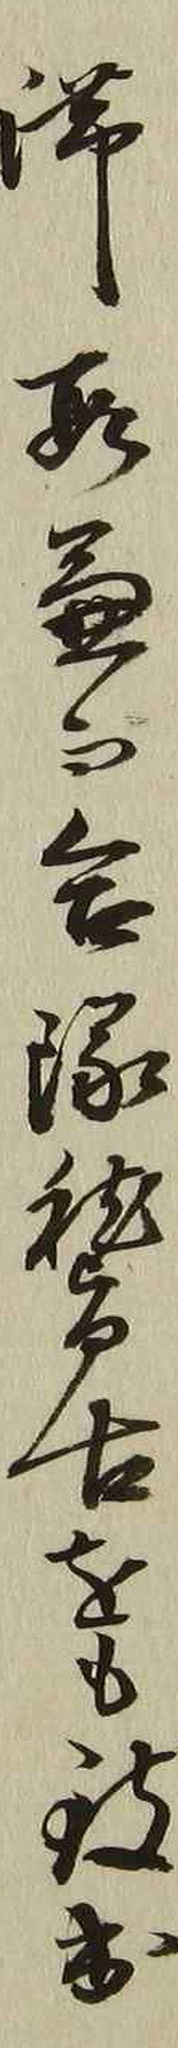滞段兼而合隊稽古をも致出
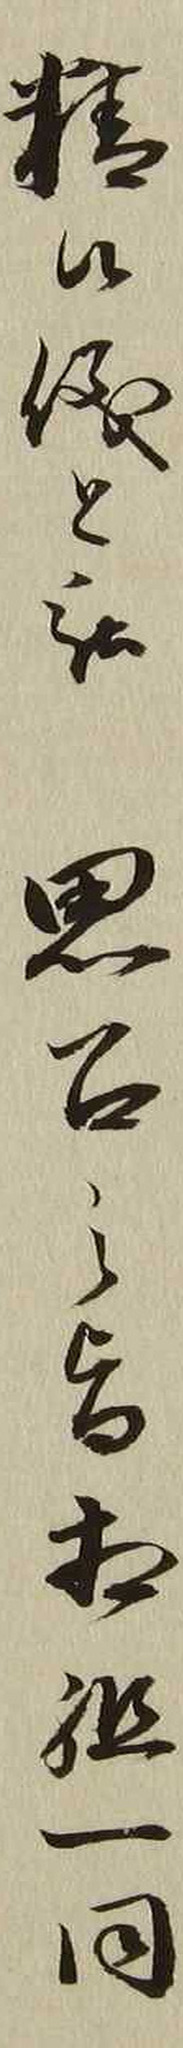精候儀と被思召之旨相組一同
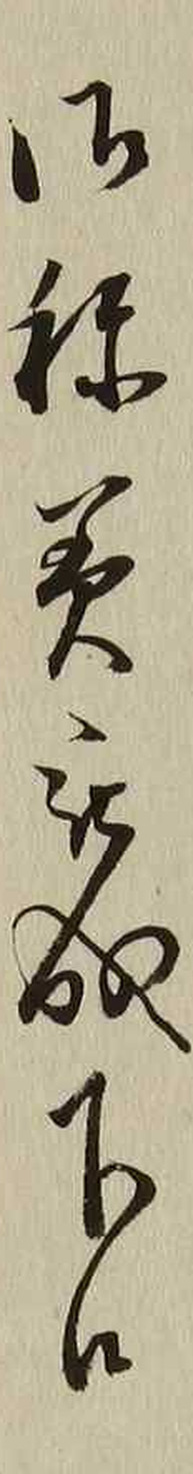御称美被成下候
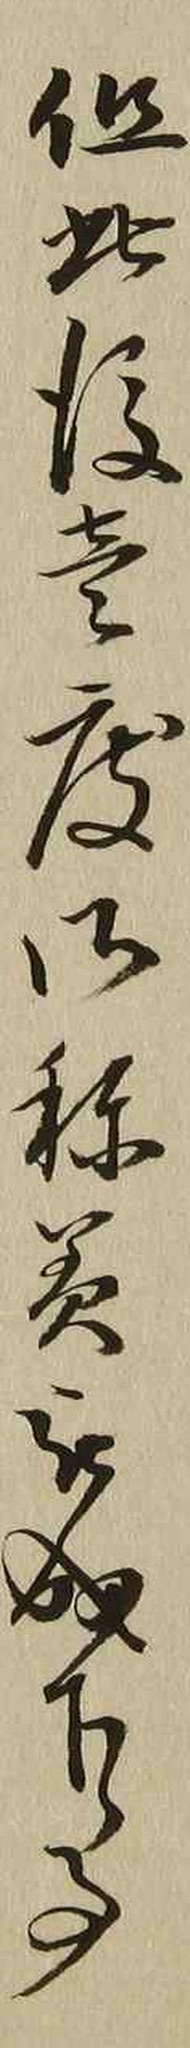但此後壱度御称美被成下候事
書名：諸士系譜　巻之61　と之部4
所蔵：会津若松市立会津図書館
